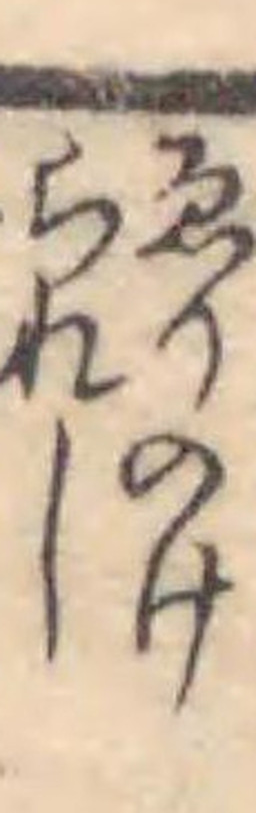られし
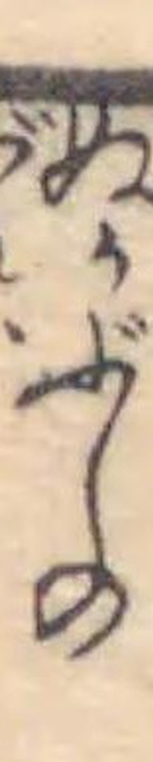ぬかぶしの
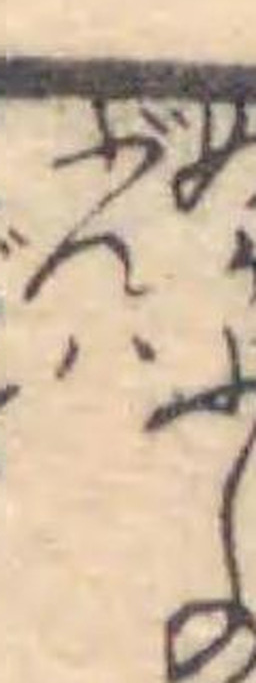ぶんは
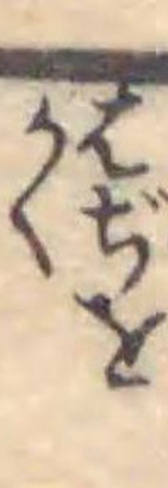はぢを
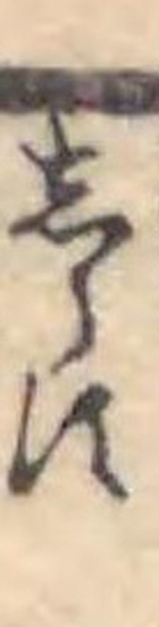しらす
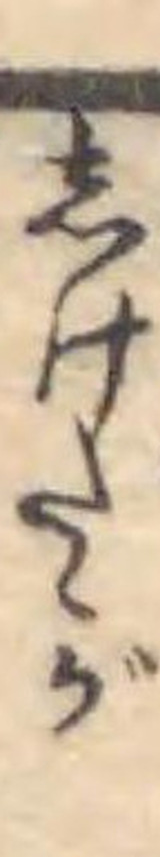しけたゝが
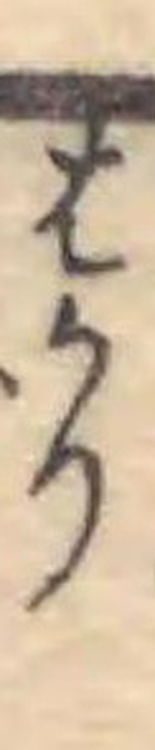はかり
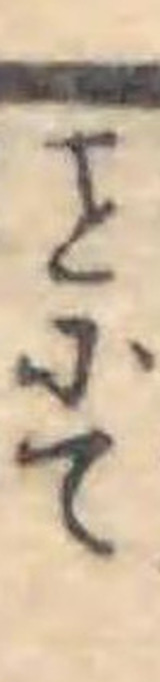ことにて
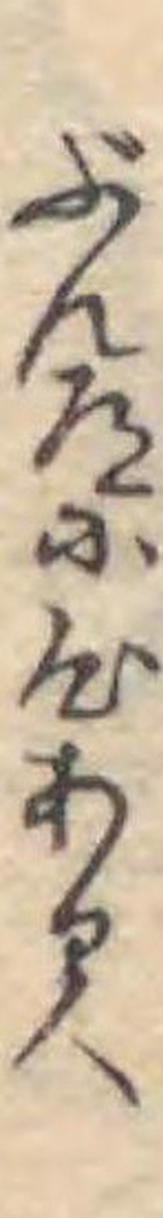ぶん道に心ある人
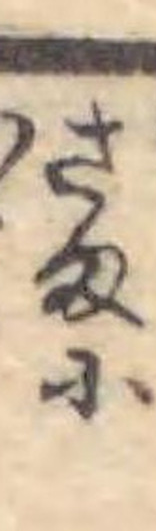さまに
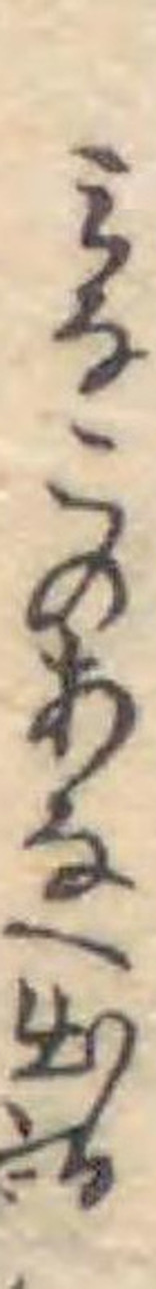こなこのあなへ出る
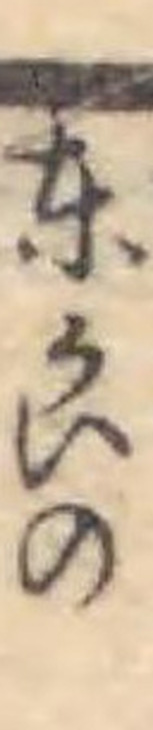東かいの
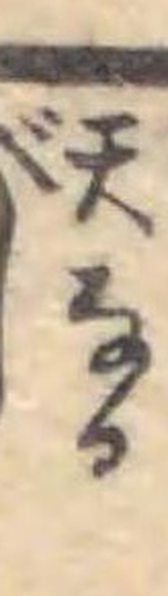天なる
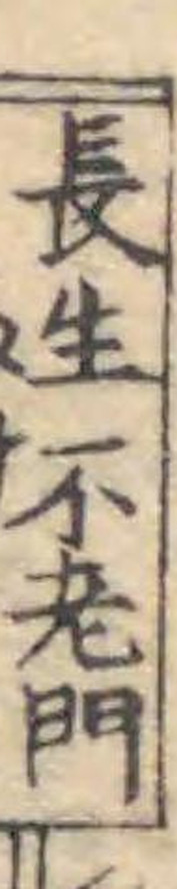長生不老文
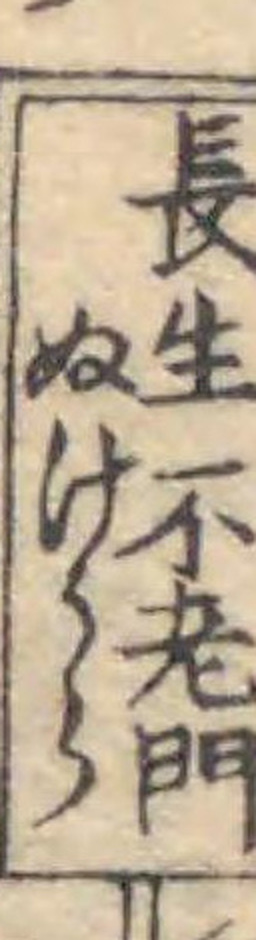ぬけうら
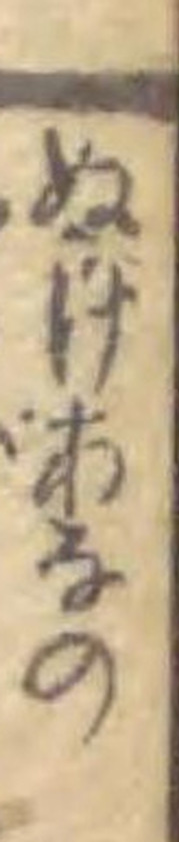ぬけあなの
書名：文武二道万石通 : 3巻
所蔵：国立国会図書館 National Diet Library, JAPAN
